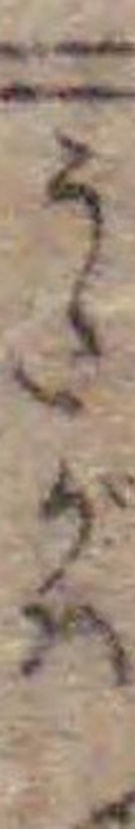うたがは

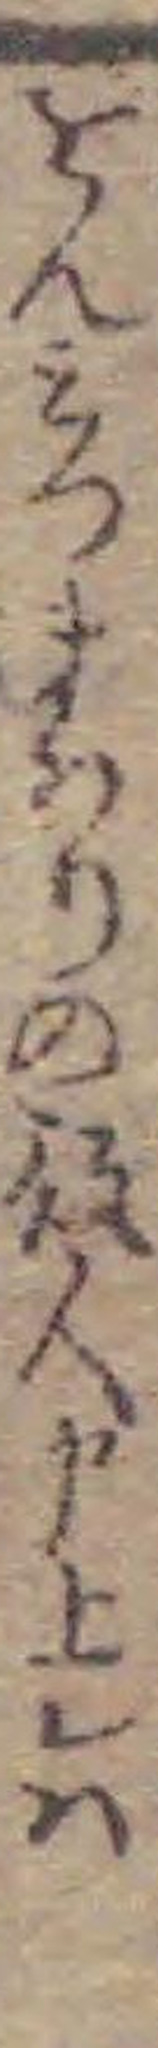をんみつまはりの役人申上れは
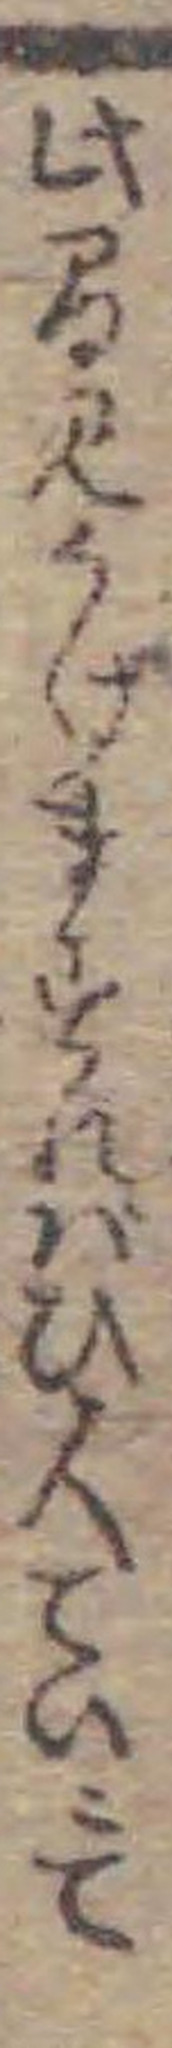此間見かけますれば非人ていにて
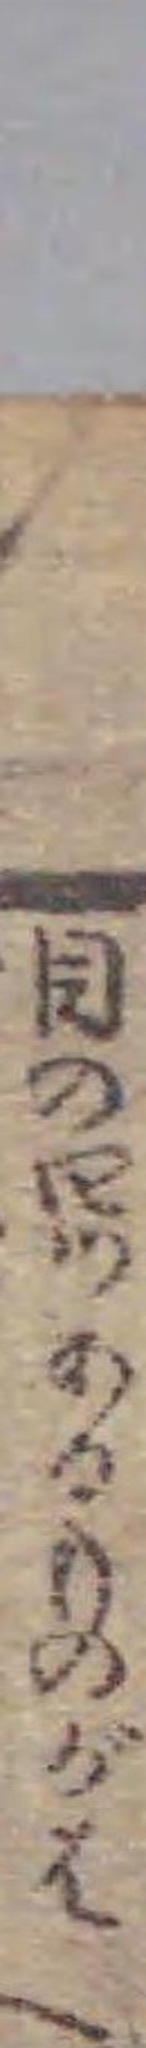目の四つあるものが
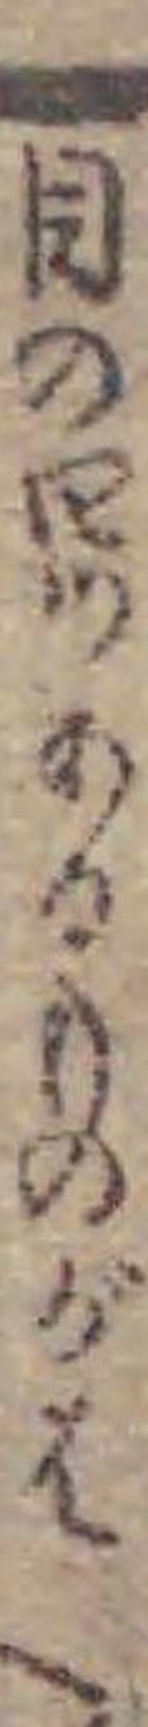目の四つあるものが
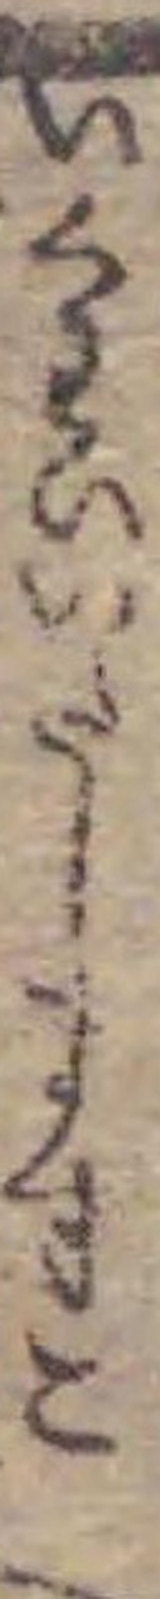はいくわいいたしますこ
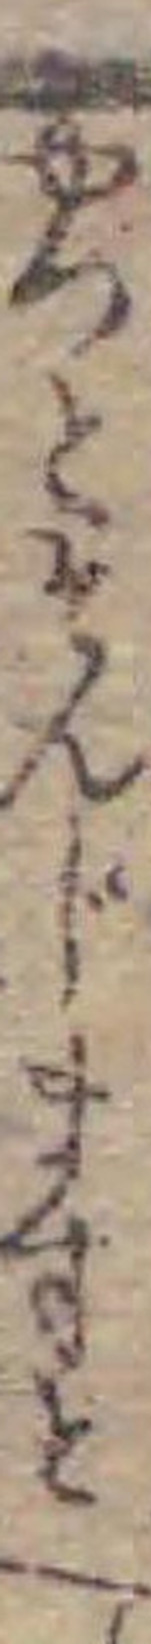やつとそんじますと
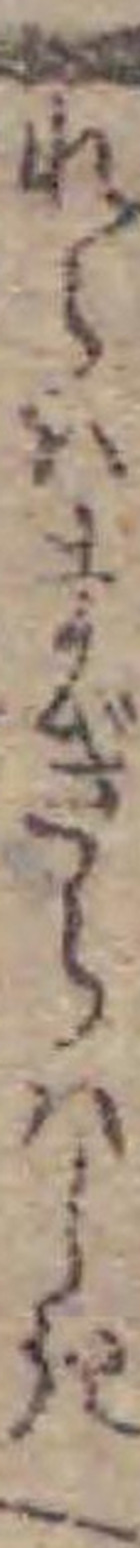れらはまぎらはしき
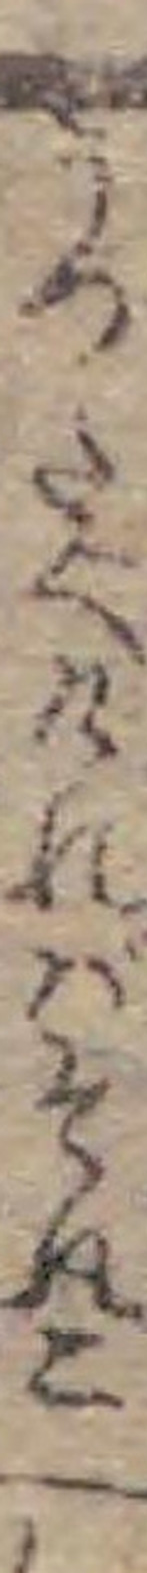うつたへければそれこ
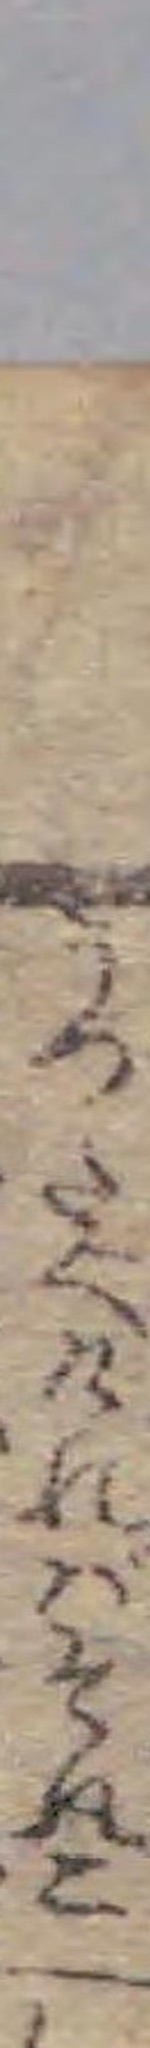うつたへければそれこ
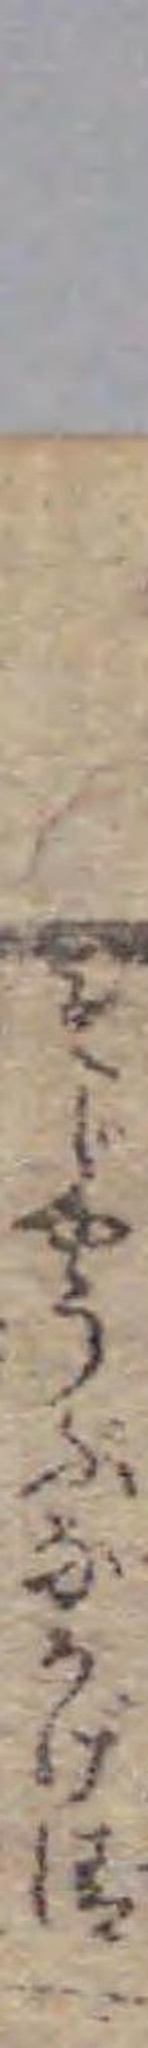そじやうぶなかげ清
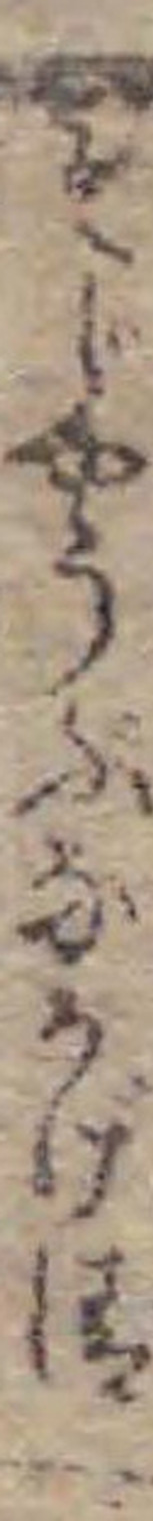そじやうぶなかげ清
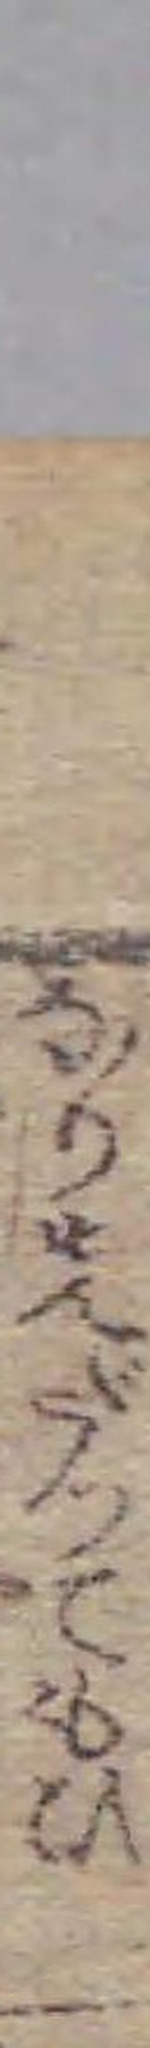なり先だつてもひ
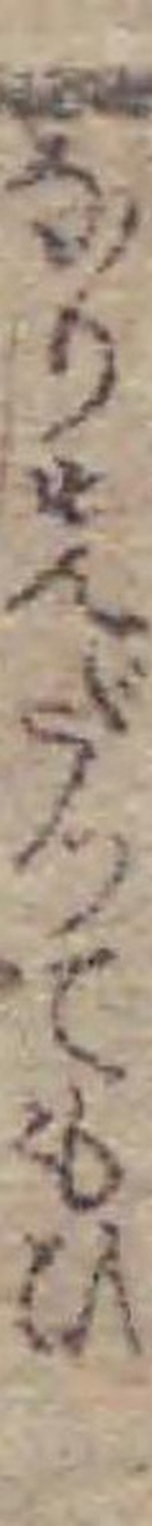なり先だつてもひ
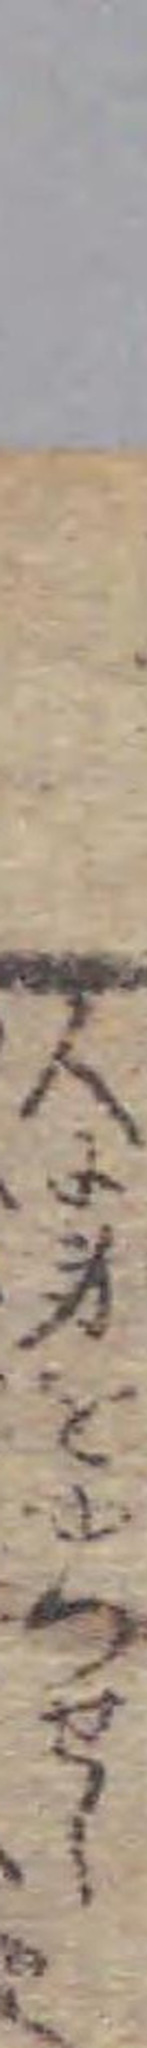人に身をやつせし
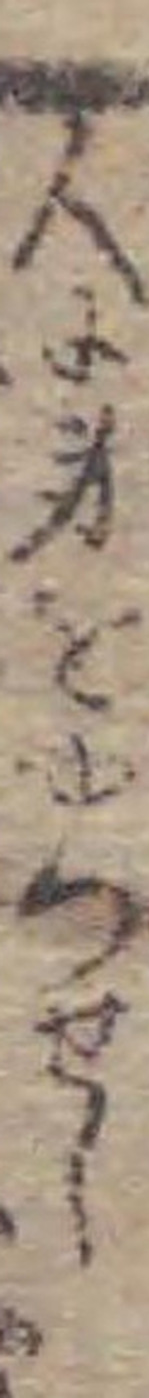人に身をやつせし
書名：悪七変目景清 : 2巻
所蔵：国立国会図書館 National Diet Library, JAPAN
